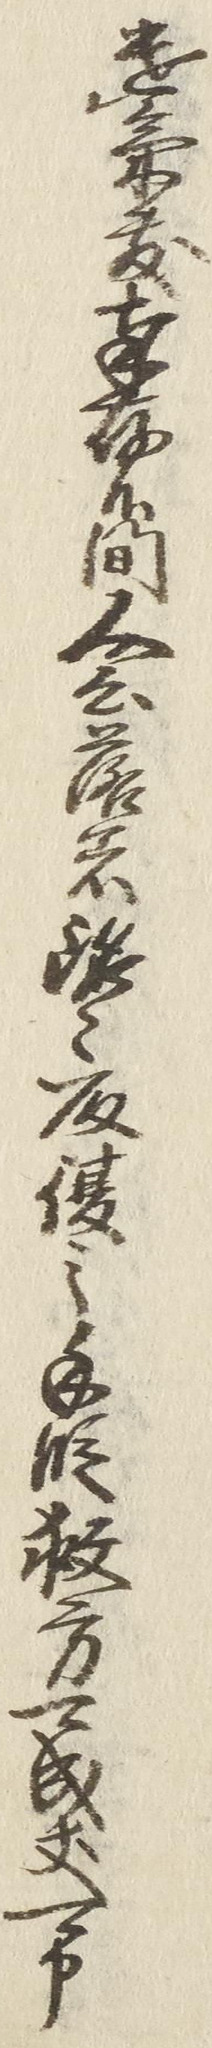遣兼敷奉存候間人心落は銘々反復之手段救方可成丈可申
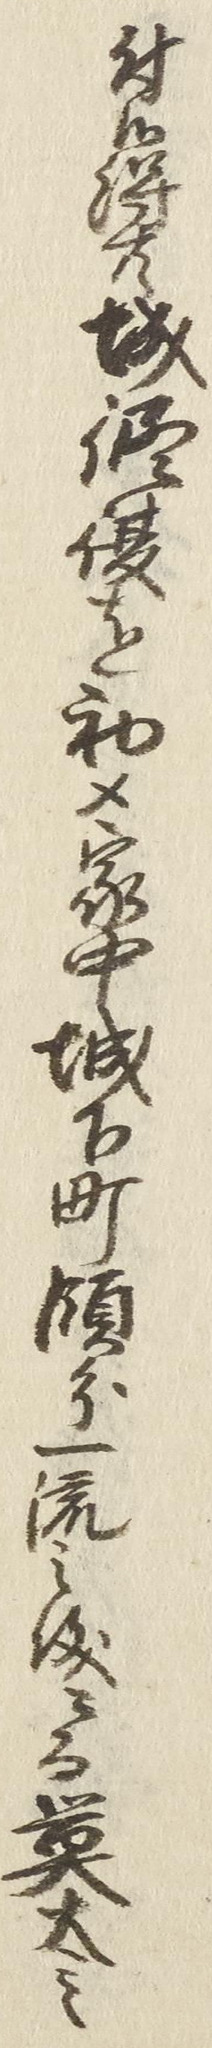付候得共城修復を初メ家中城下町領分一統之儀二而莫太之
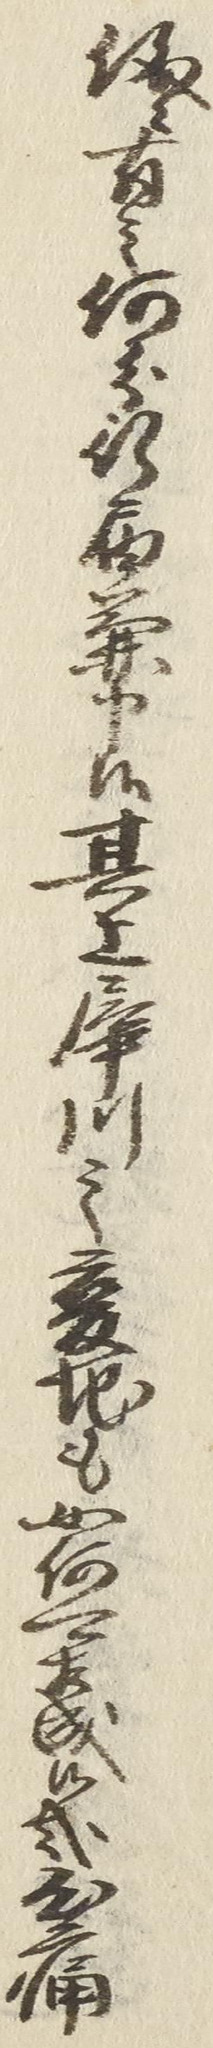儀二有之何分行届兼申候其上犀川之変地も如何相成候哉心痛
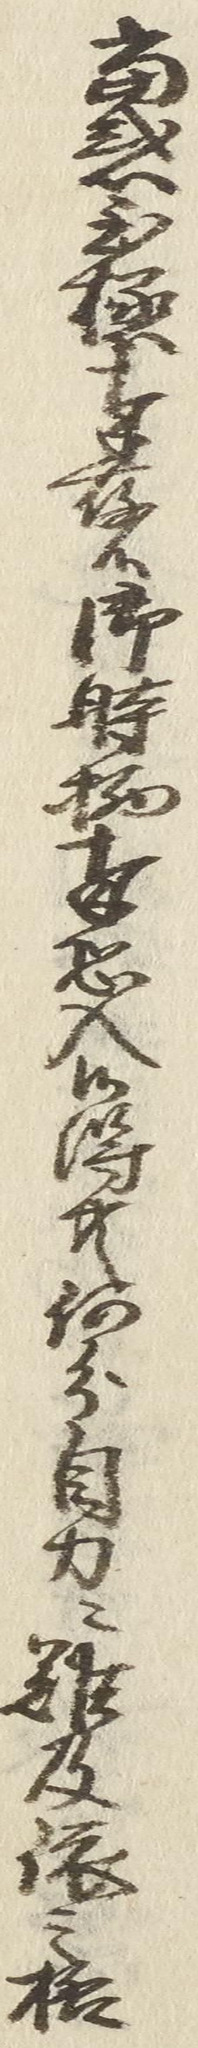当惑至極奉存候御時柄奉恐入候得共何分自力二難及依之格
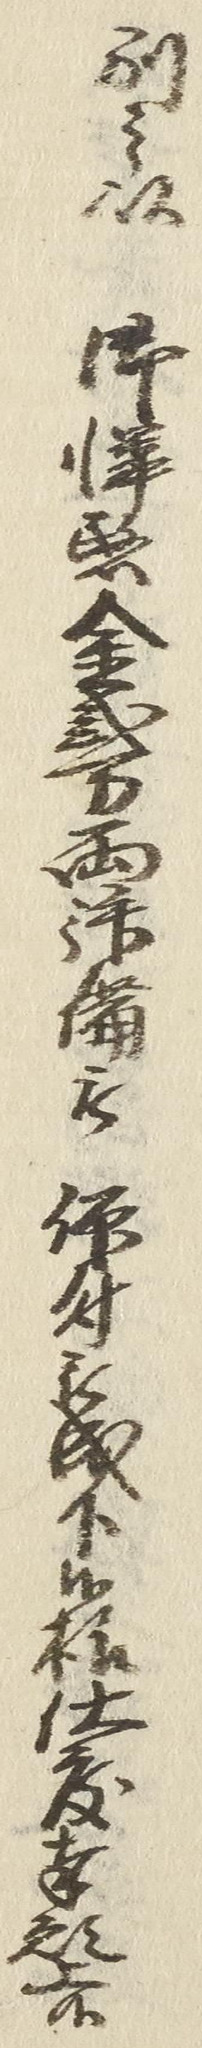別之以御憐憫金弐萬両拝備被仰付被成下候様仕度奉願上侯
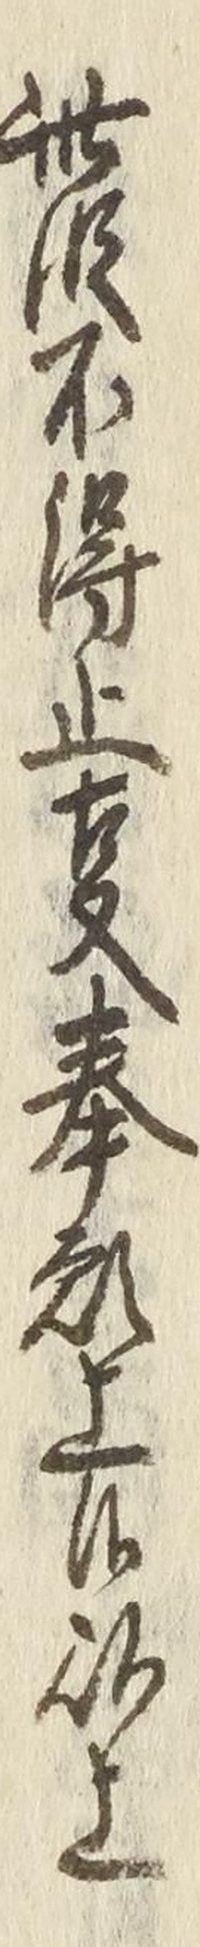此段不得止事奉願上候以上
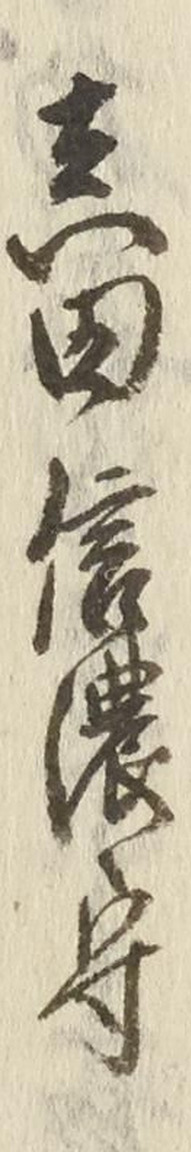真田信濃守
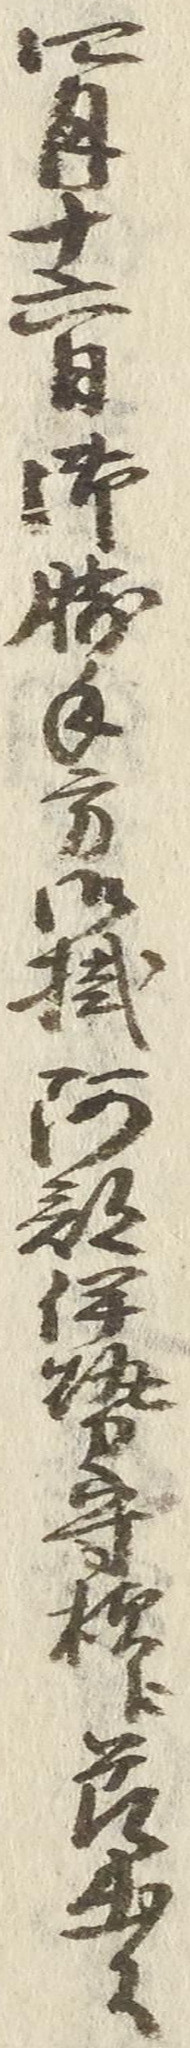四月十六日御勝手方御掛阿郡伊勢守様江差出ス
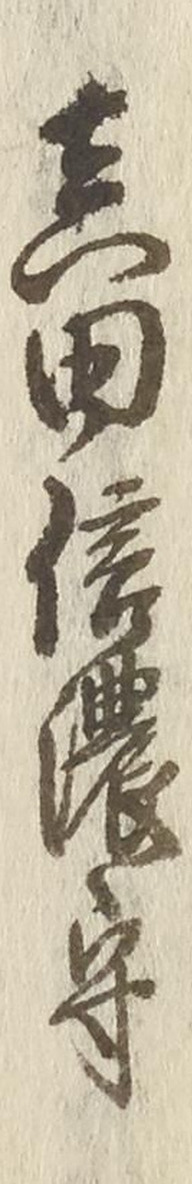真田信濃守
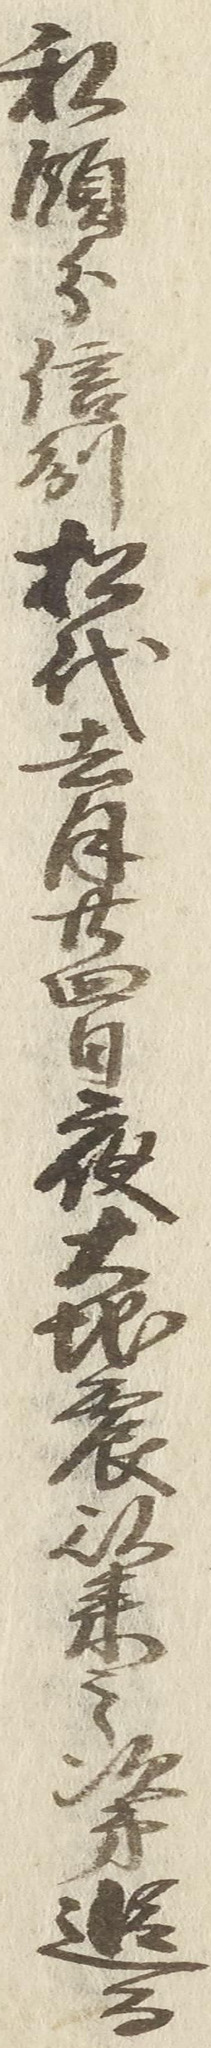私領分信州松代去月廿四日夜大地震以来之次第追而
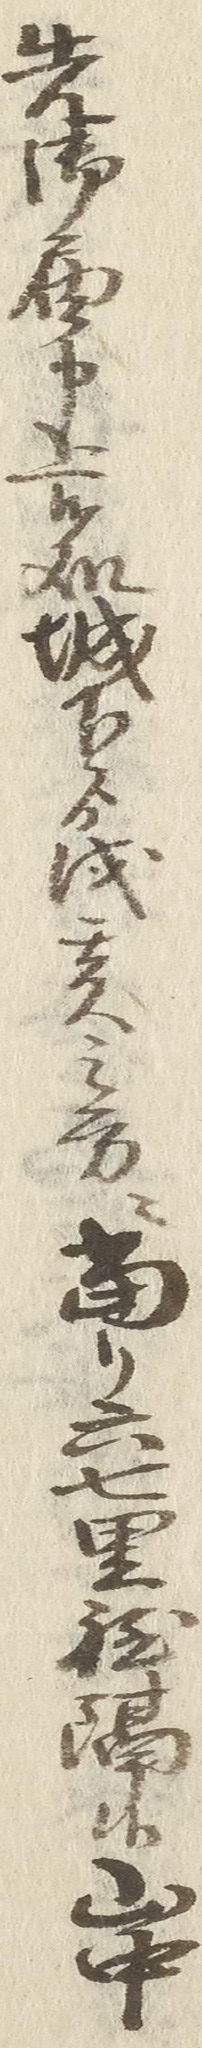先御届申上候処城下ゟ戌亥之方二当り六七里程隔り候山中
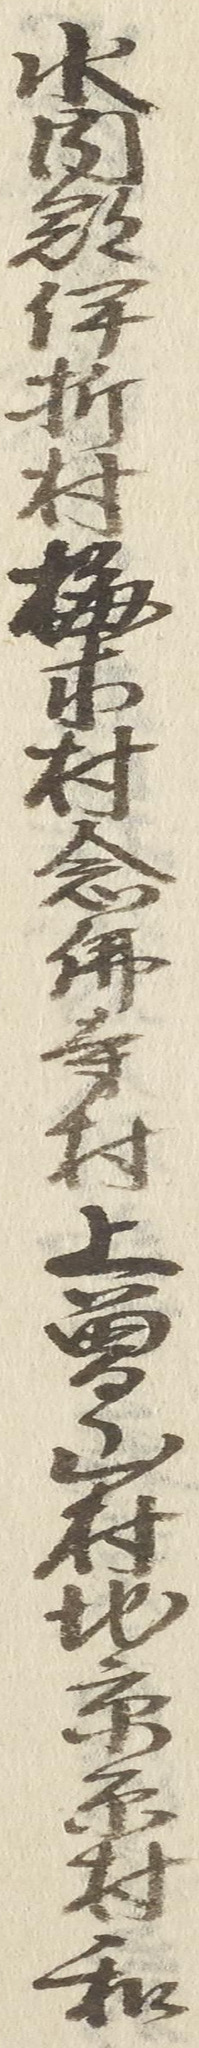水内郡伊折村梅木村念仏寺村上曾山村地京ヶ原村和
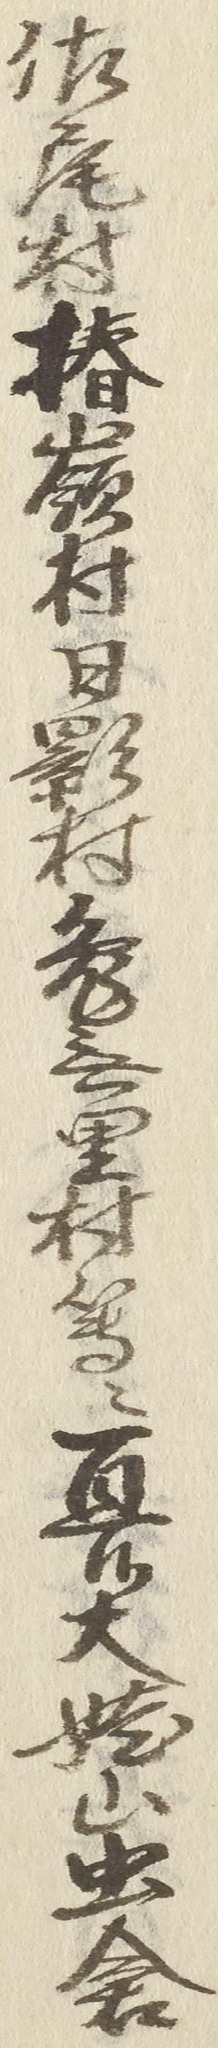佐尾村椿嶺村日影村鬼無里村等二亘候大姥山虫倉
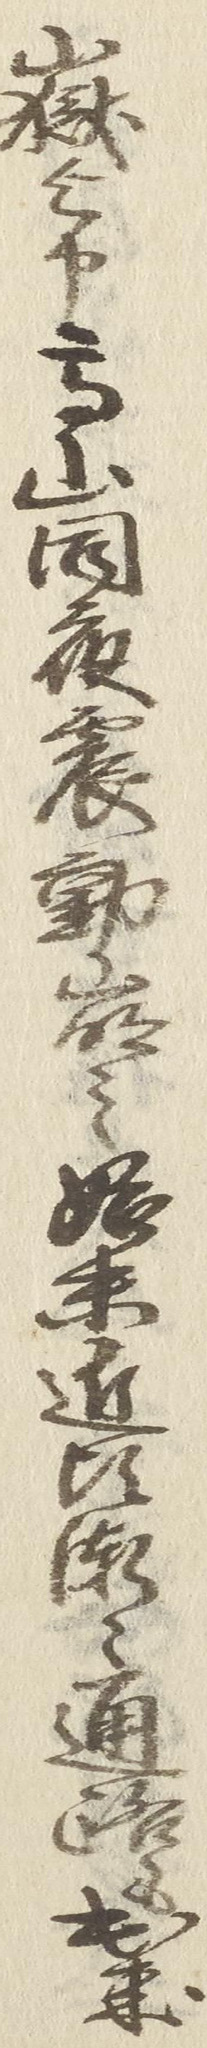嶽と申高山同夜震動崩候始末近頃漸々通路も出来
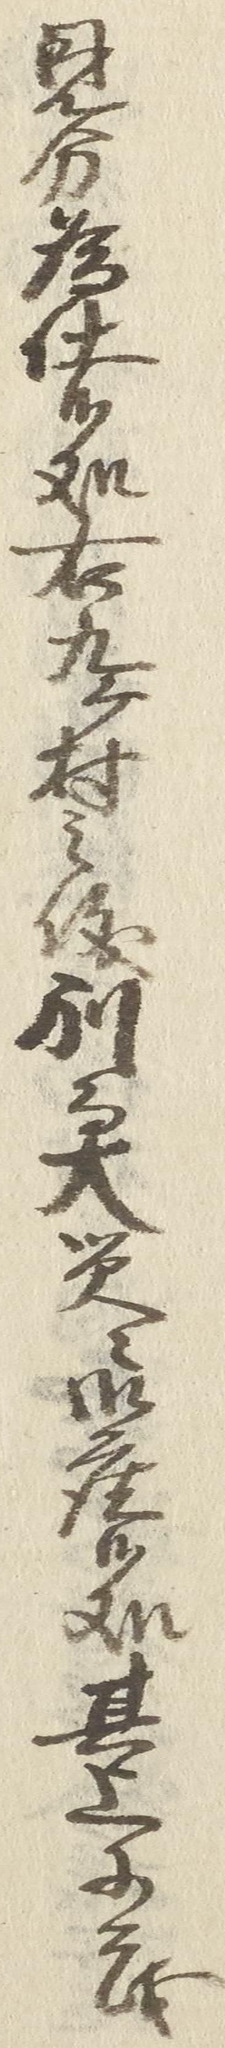見分為仕候処右九ヶ村之儀ハ別而大災二御座候所処其上にも
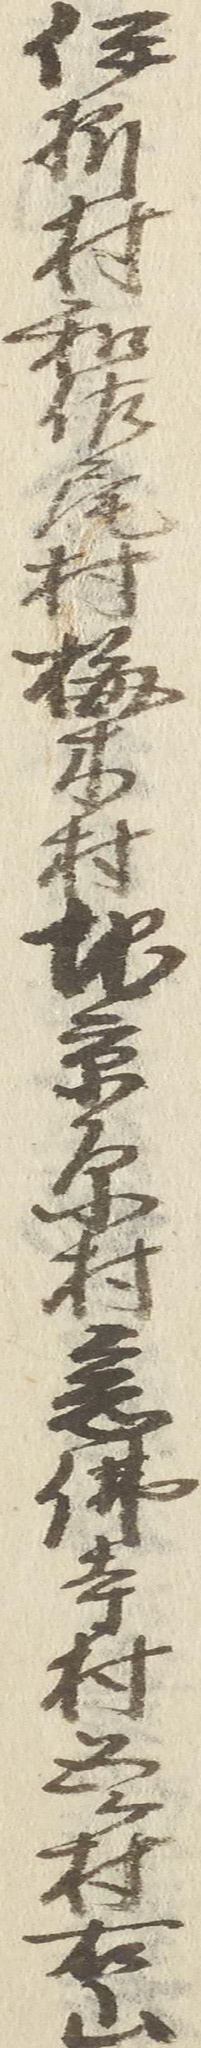伊折村和佐尾村梅木村地京原村念仏寺村之五ヶ村右山
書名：従往古地震御届書記誌之一
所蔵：東京大学地震研究所図書室 Earthquake Research Institute Library, The University of Tokyo, JAPAN
